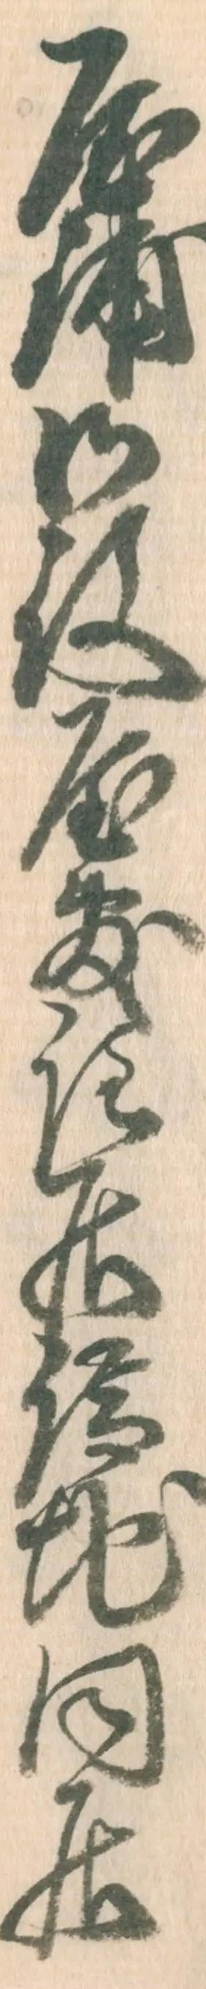屋鋪御役屋敷住居借地同居
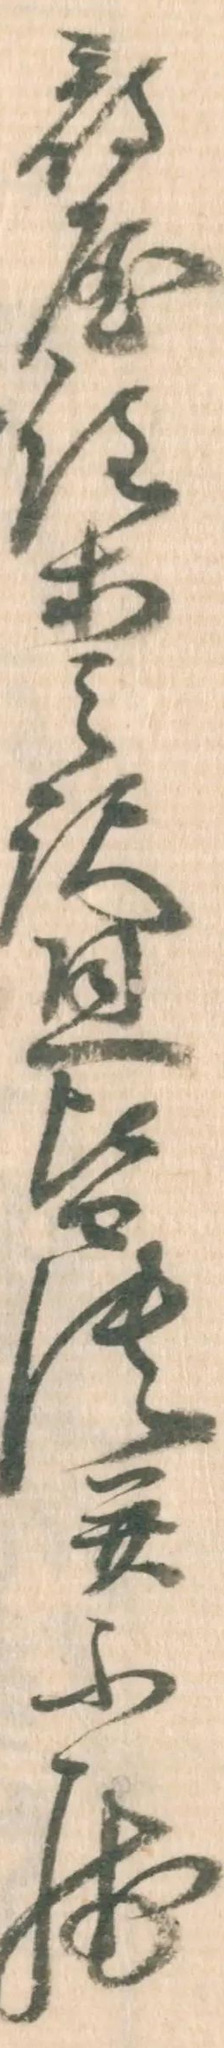部屋住等之訳且皆潰幷不残
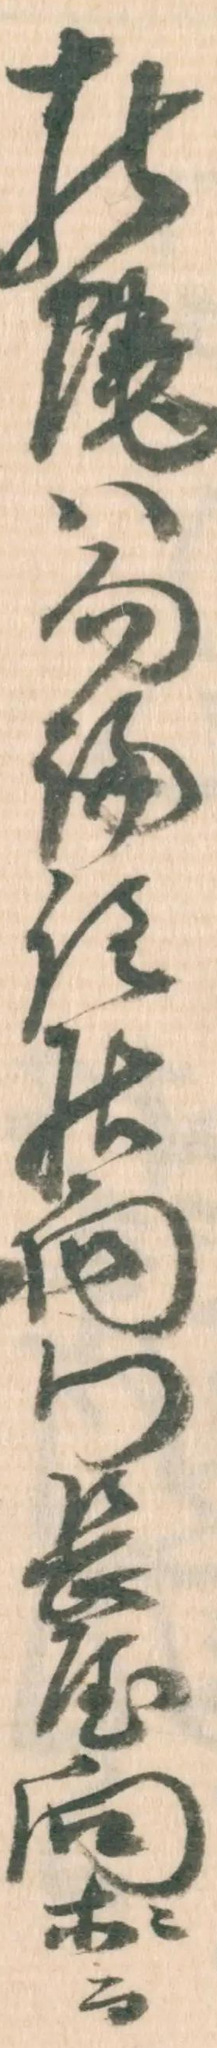類焼ハ勿論住居向門長屋向等ニて
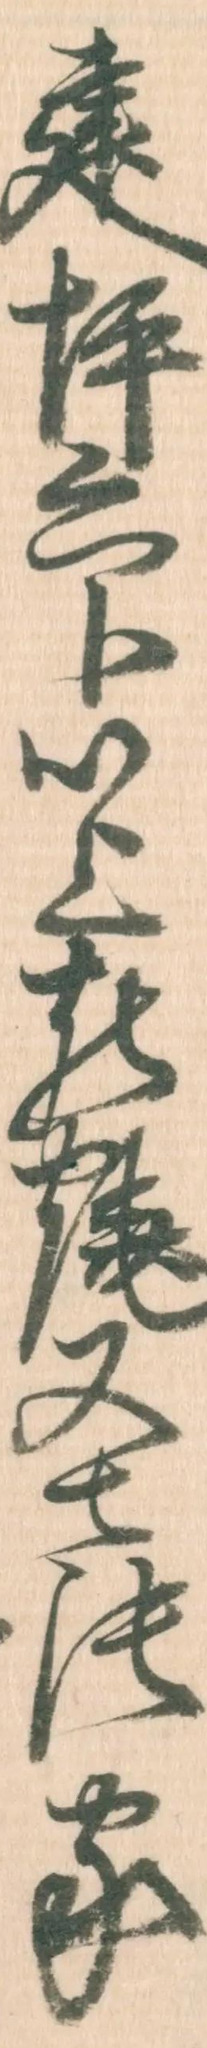建坪六分以上類焼又は潰家
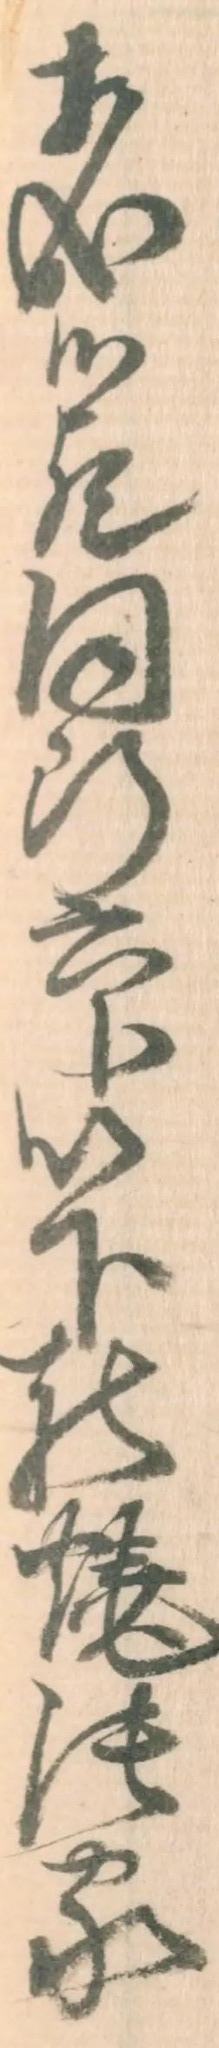相成候歟同断六分以下類焼潰家
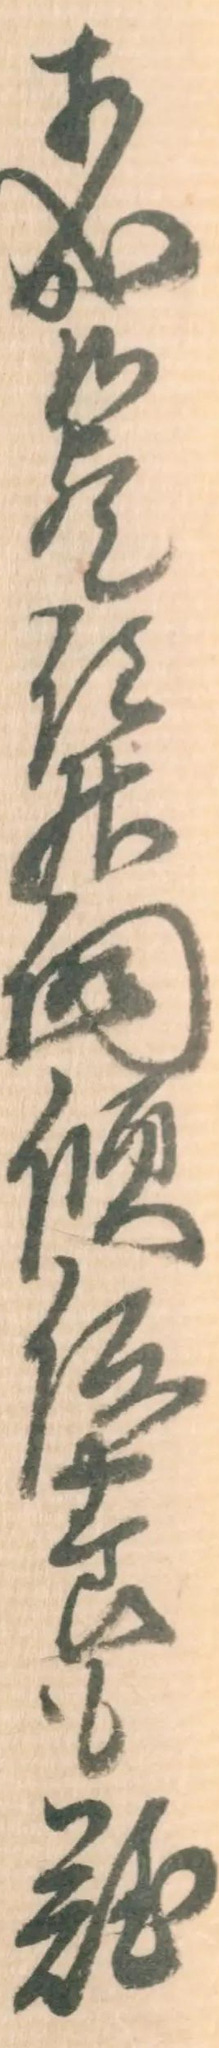相成候歟住居向傾仮すまいも難
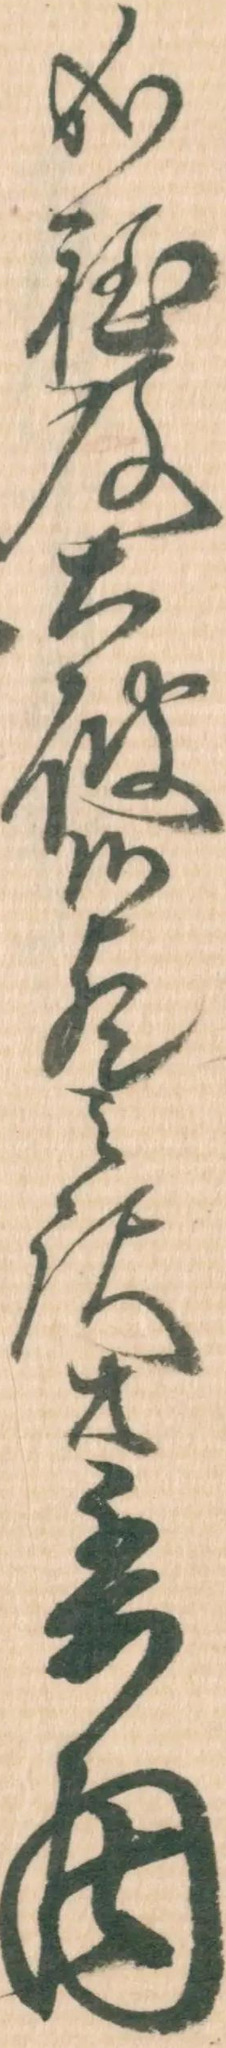成程及大破候歟之訳共委細
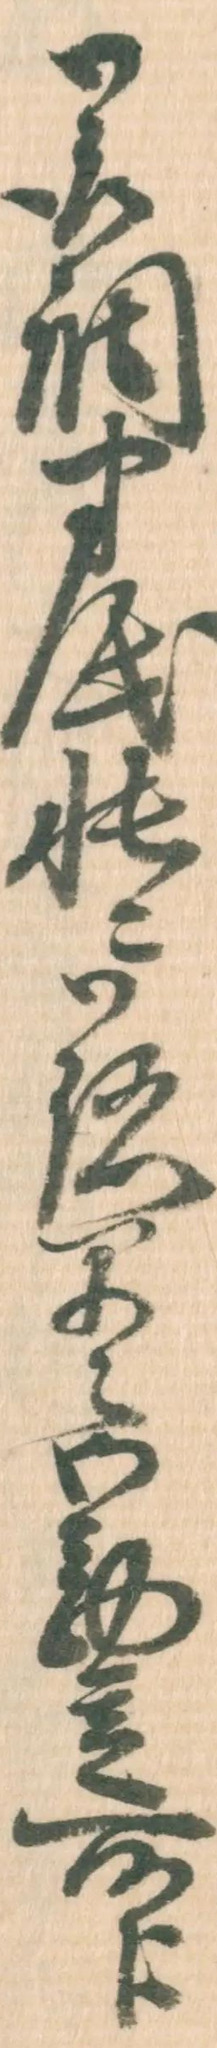御取調半紙帳ニ御認早〻御勘定所え
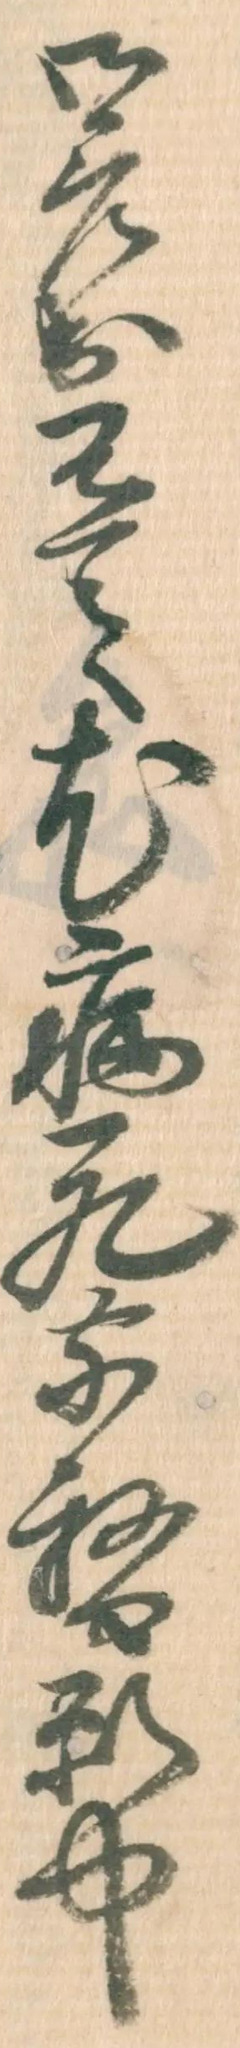御差出有之候尤病死家替願中
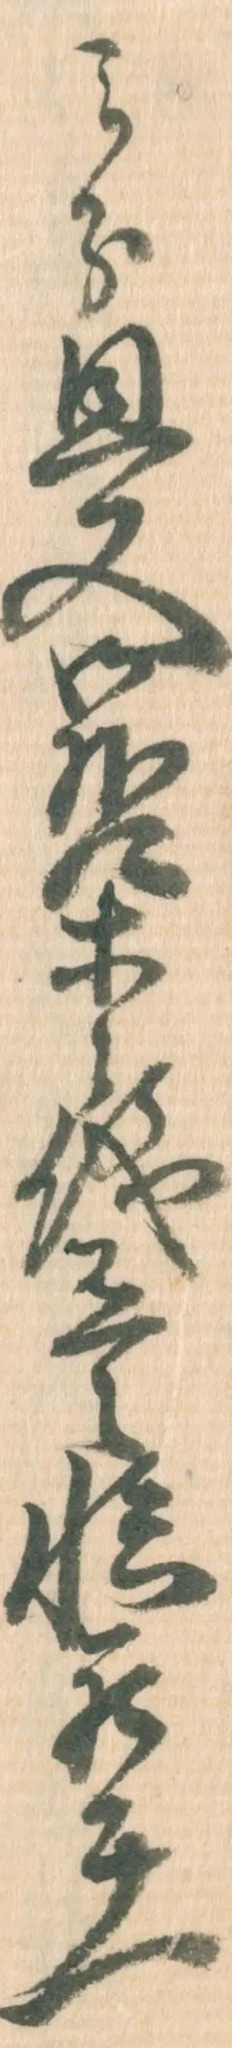之分且又御咎等之儀有之慎罷在
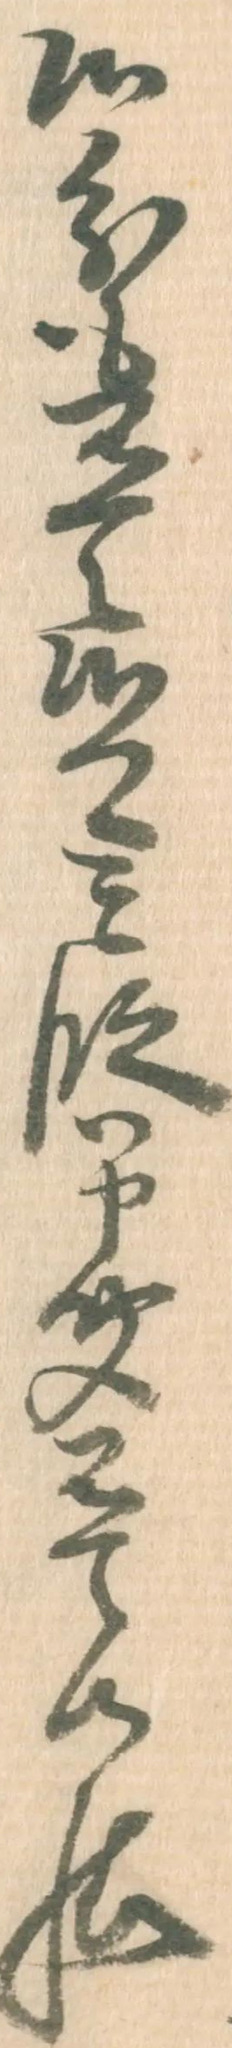候分も有之候ハヽ其段御申聞有之候様
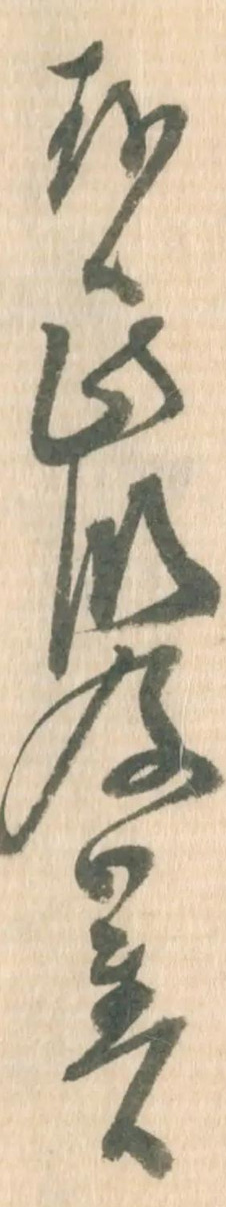存候此段及御達候

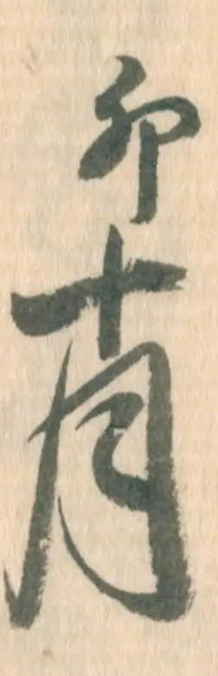卯十月
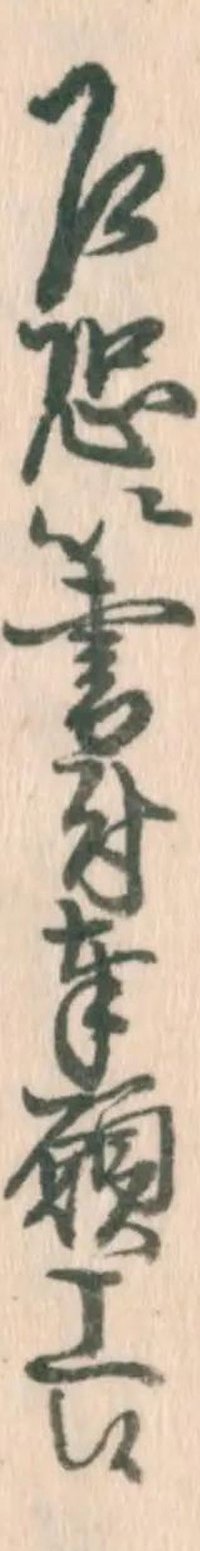乍恐以書付奉願上候
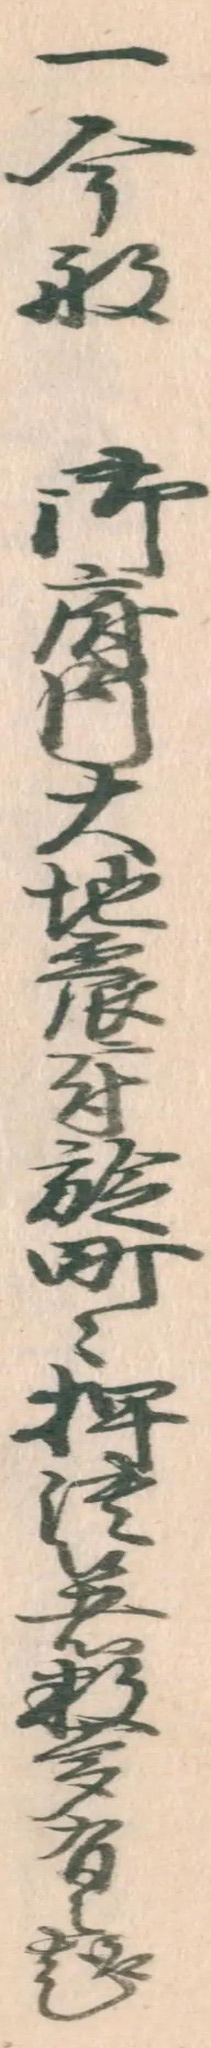一今般御府内大地震ニ付於町〻ニ押潰候者数多有之趣
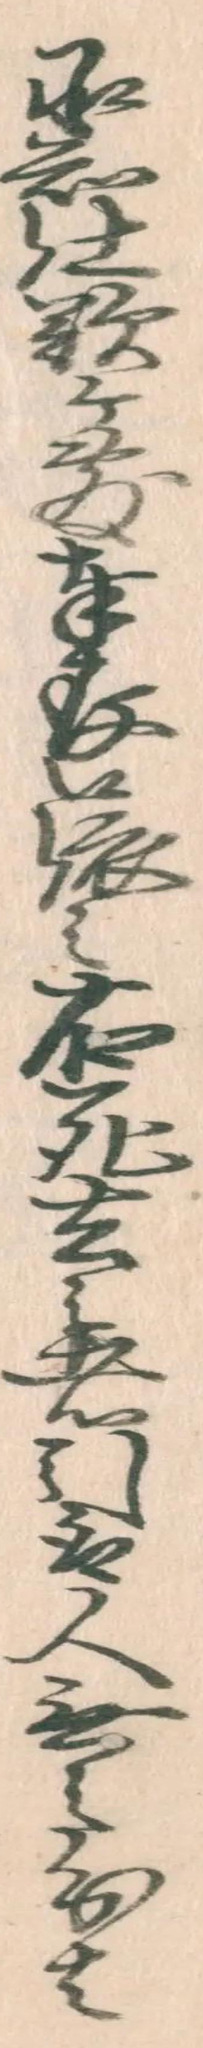承知仕歎ケ敷奉存候依之右死去之者引取人無之分は
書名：地震災書留 2巻. [2] 内表紙に「地震一件　安政二卯年十月」とあり
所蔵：国立国会図書館 National Diet Library, JAPAN
